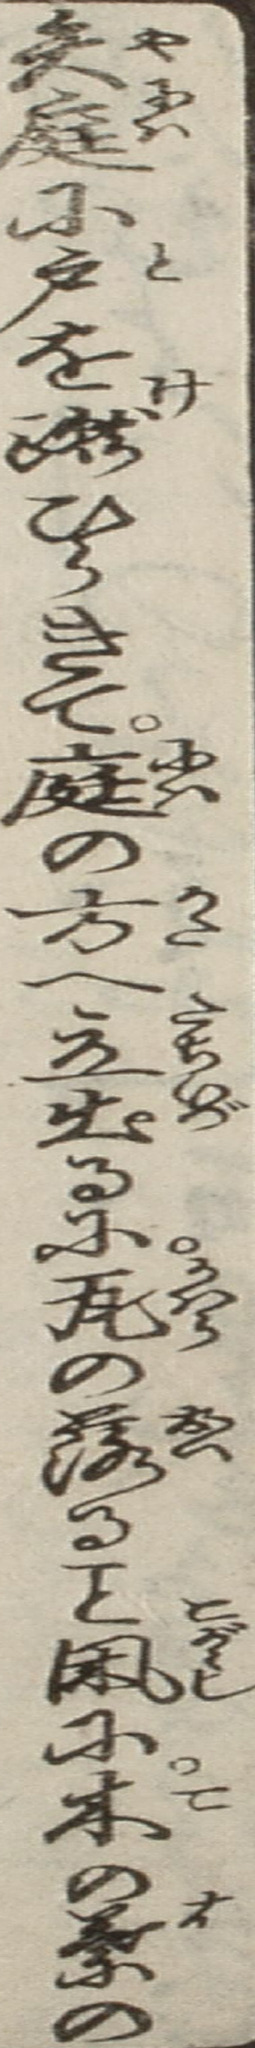矢庭に戸を蹴ひらきて。庭の方へ立出るに。瓦の落ること凩に。木の葉の
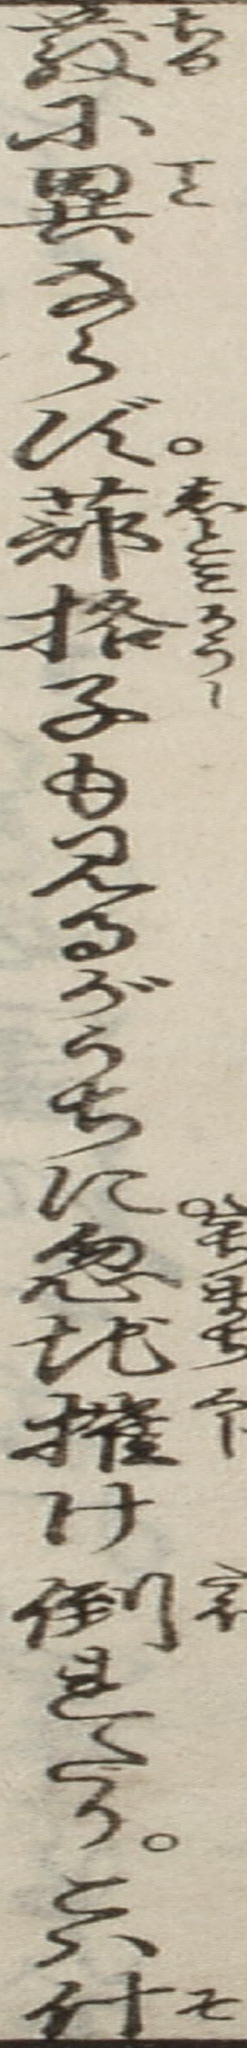散に異ならず。蔀格子もみるがうちに。忽地摧け倒れたり。こは什
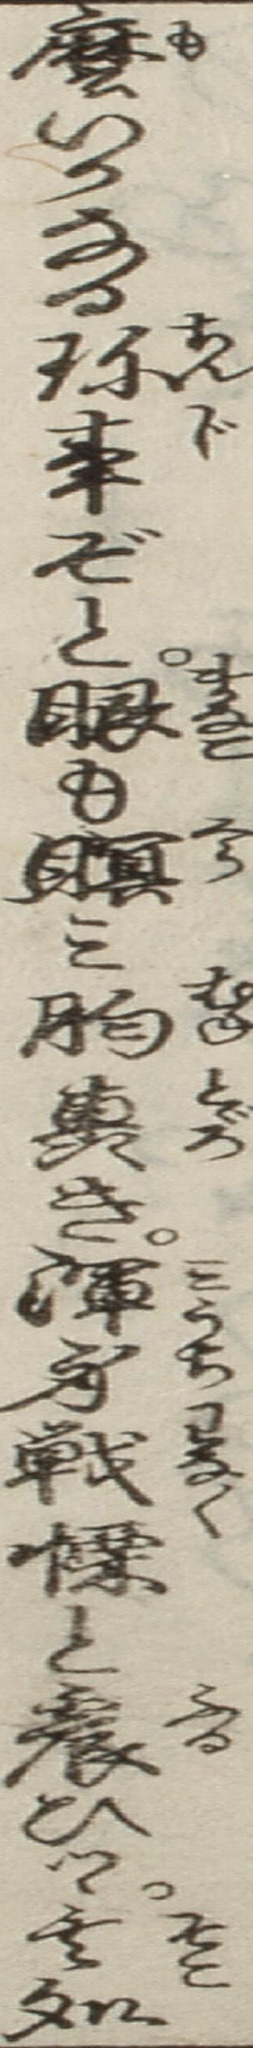麽いかなる珍事ぞと。眼も瞑み胸轟き。渾身戦慄と震ひつゝ。其処
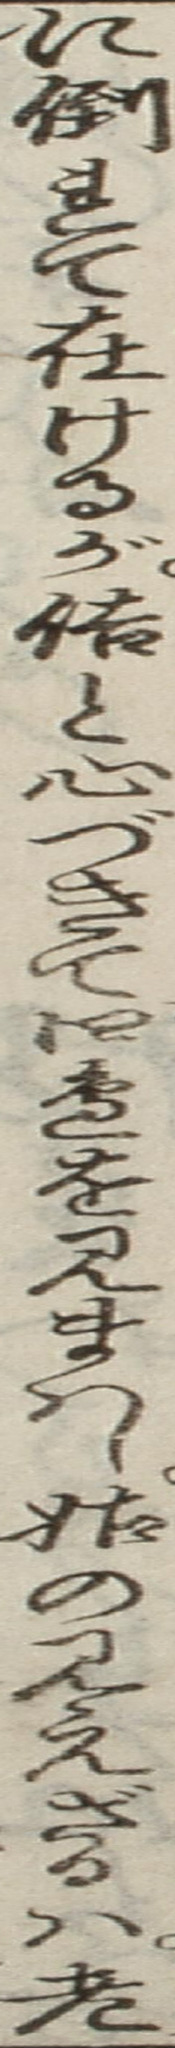に倒れて在けるが。佶と心づきて四辺を見まはし。姑の見えざるは。老
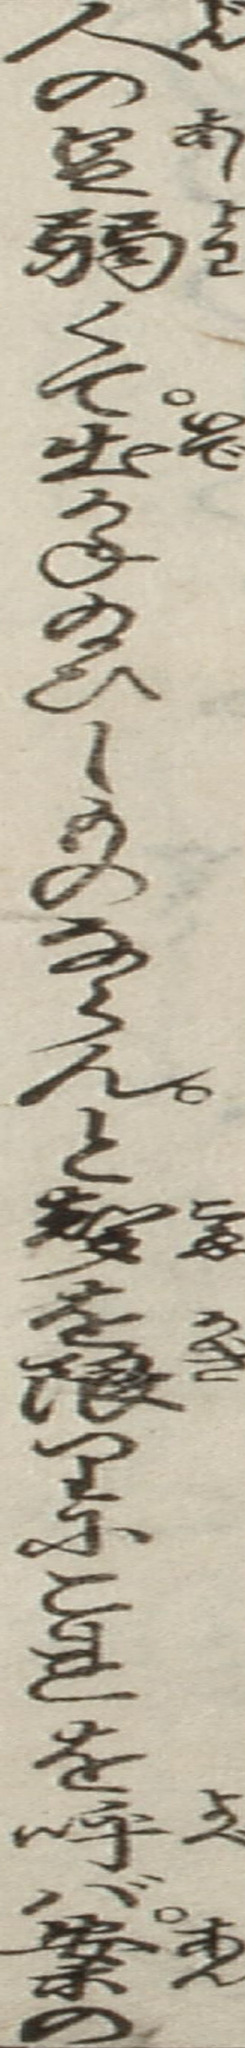人の足弱くて。出かね給ひしものならん。と声を限りにこれを呼ば。案の
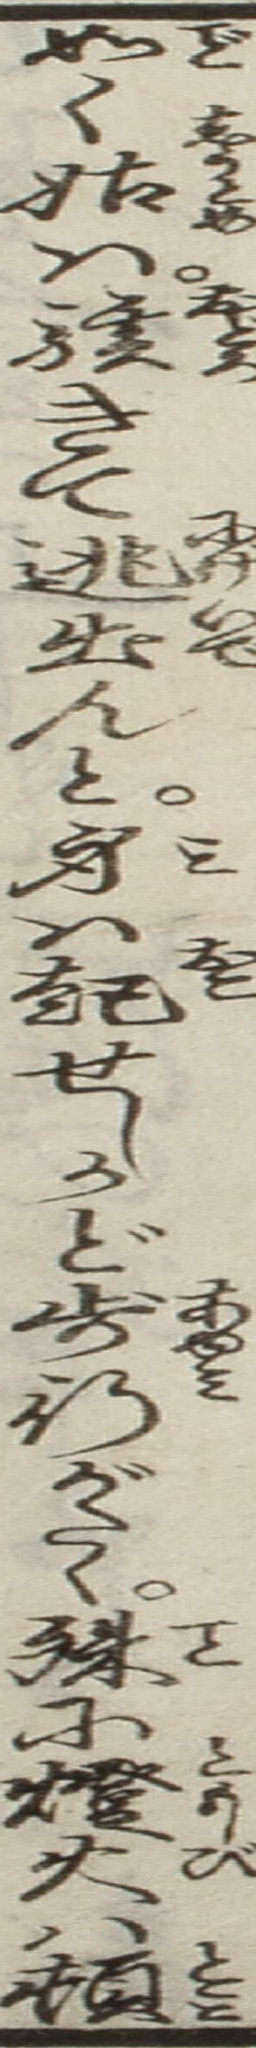如く姑は。駭きて逃出んと。身は起せしかど歩行がたく。殊に燈火は頓
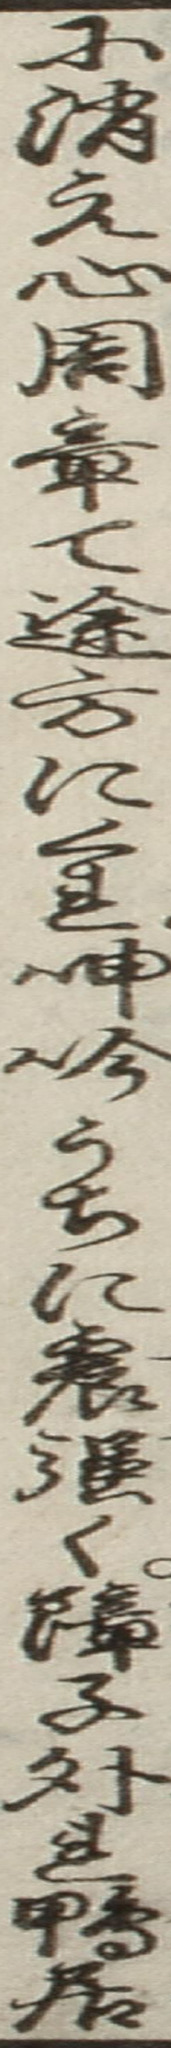に消え。心周章て途方にくれ。呻吟うちに震強く。障子外れ鴨居
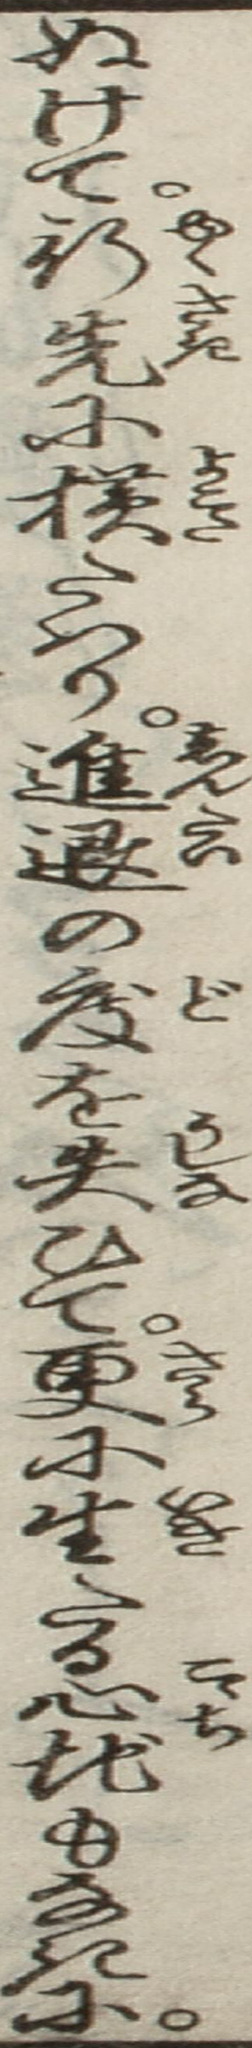ぬけて。行先に横たわり。進退の度を失ひて。更に生たる心地もなきに。
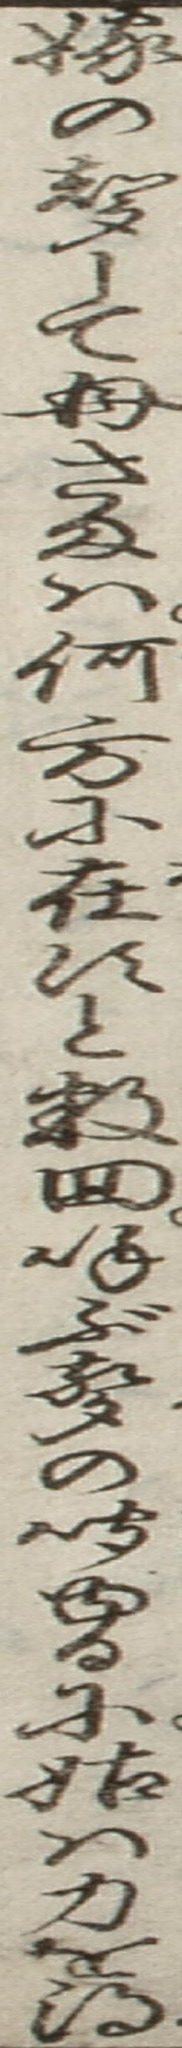嫁の声して母さまは。何方に在すと数回。呼ぶ声の聞ゆるに。姑は力を得
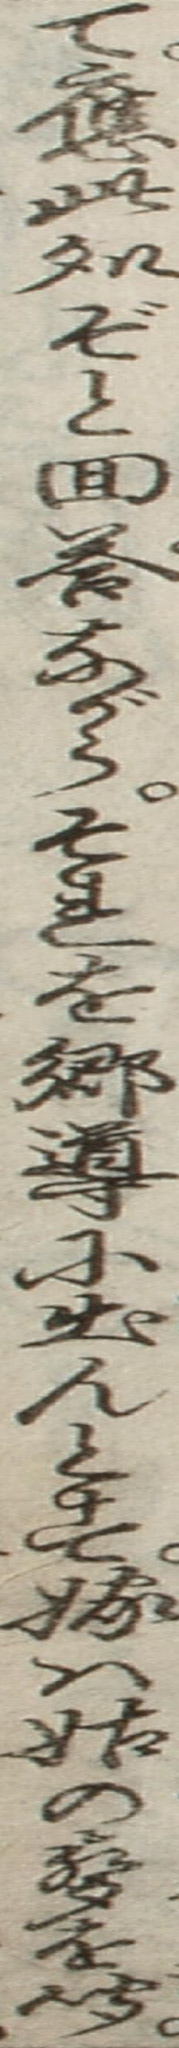て。応此処ぞと回答ながら。それを郷導に出んとす。嫁は姑の声を聞。
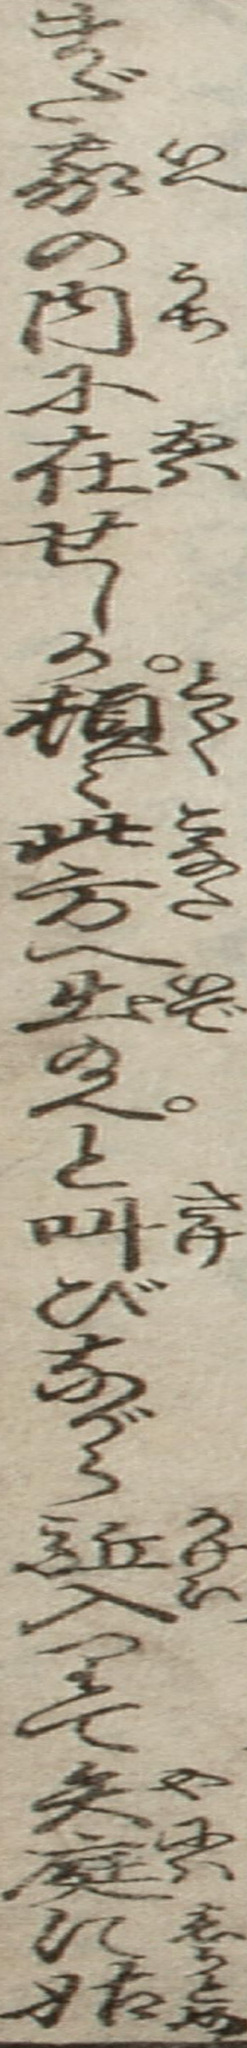まだ家の内に在せしか。頓〻此方へ出給へ。と叫びながら駈入りて矢庭に姑

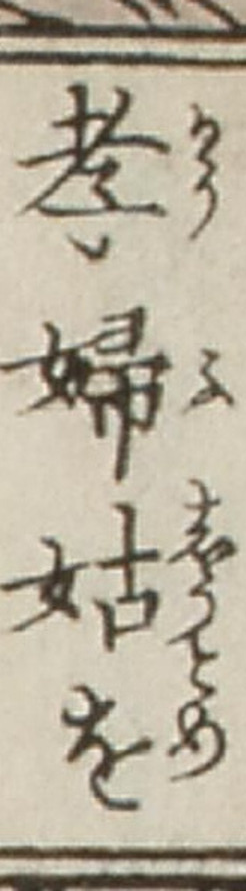孝婦姑を
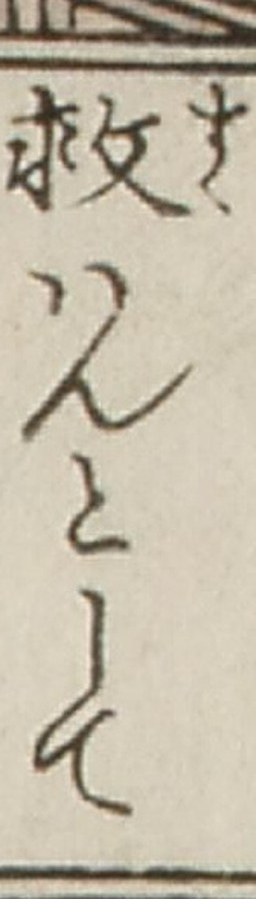救はんとして
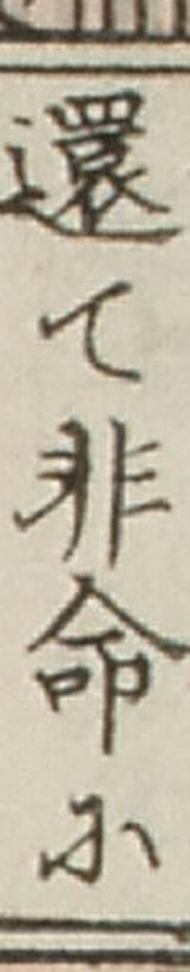還て非命に

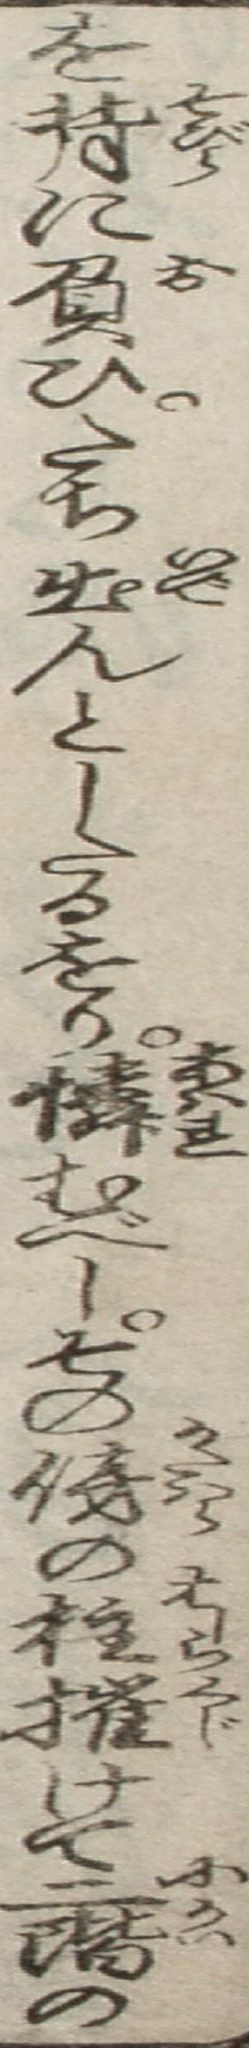を背に負ひ。たち出んとしたるをり。憐むべし。その傍の柱摧けて二階の
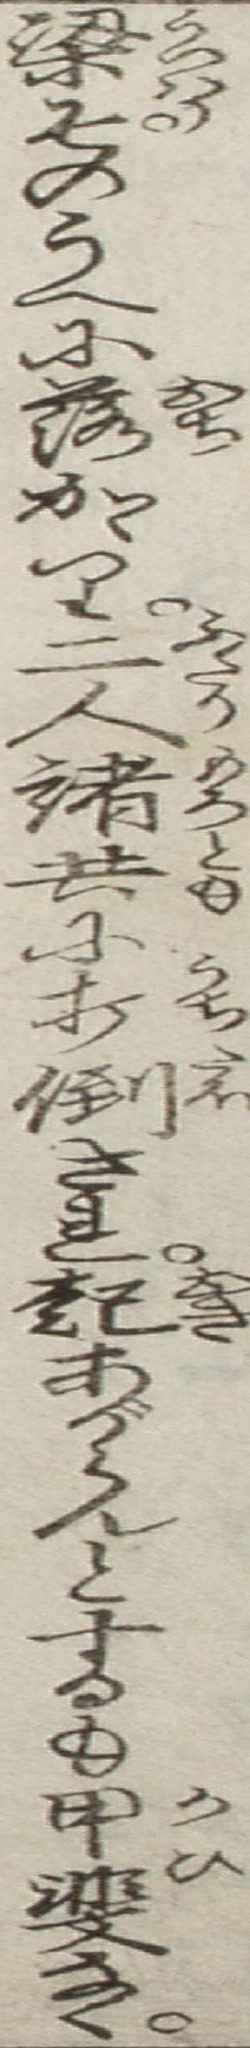梁。そのうへに落かゝり。二人諸共に打倒され。起あがらんとするも甲斐なく。
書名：安政見聞録　上
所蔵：東京大学地震研究所図書室 Earthquake Research Institute Library, The University of Tokyo, JAPAN
